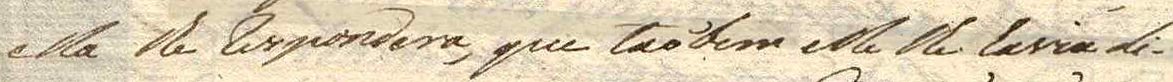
ella lhe Respondera, que taõbem elle lhe havia di
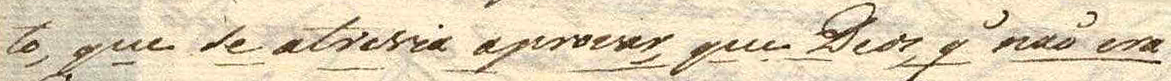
to que se atrevia a provar, que Deos q̄ naõ era
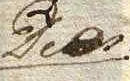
Deos.
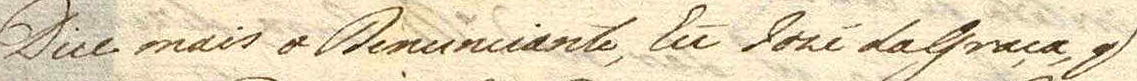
Dice mais o Denunciante, hū Iozé da Graça, q̄
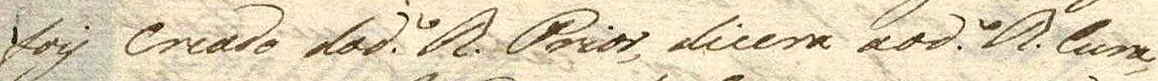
foy creado do d.o R. Prior, dicera ao d.o R. Cura,
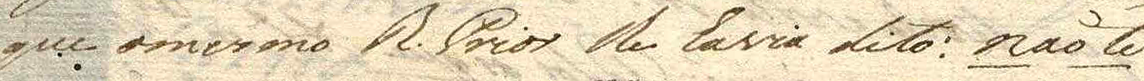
que o mesmo R. Prior lhe havia dito: naõ te
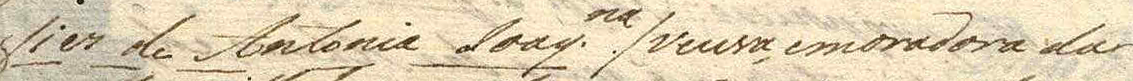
fies de Antonia Ioaq.na/ veuva, e moradora da
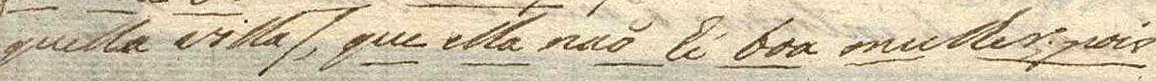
quella villa/, que ella naõ hé boa mulher, pois
